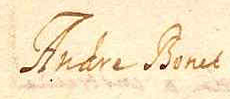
Andre Bonet
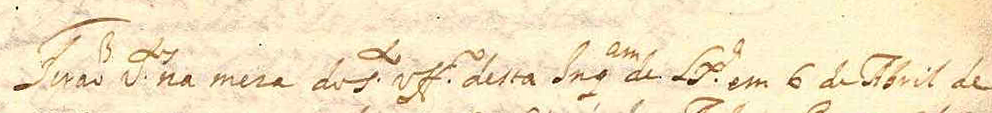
Foraõ v.tos na meza do s.to off.o desta Inq.am de Lx.a em 6 de Abril de
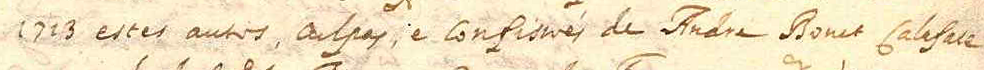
1713 estes autos, culpas; e confissoẽs de Andre Bonet Calafate
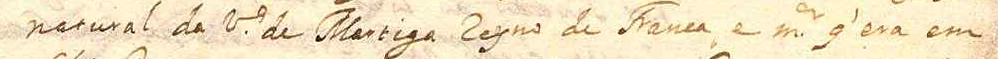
natural da V.a de Martiga Reyno de França, e m.or q̄ era em
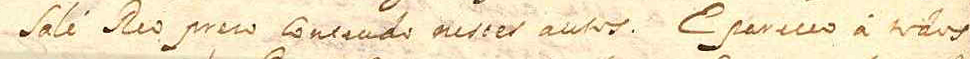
Salé Reo prezo conteudo nestes autos. E pareceo á todos
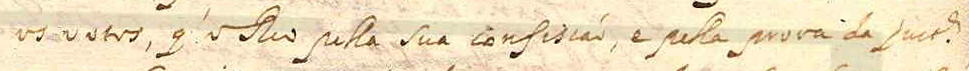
os votos, q̄ o Reo pella sua confissaõ, e pella prova da Just.a
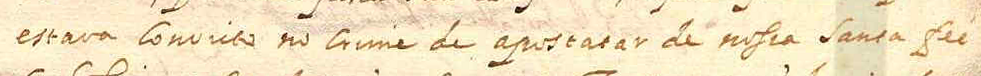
estava convicto no crime de apostatar de nossa santa feé
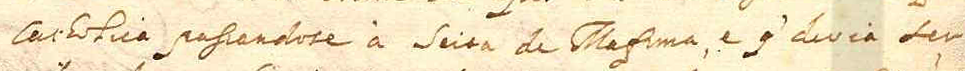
catholica passandose à seita de Mafoma, e q̄ deuia ser
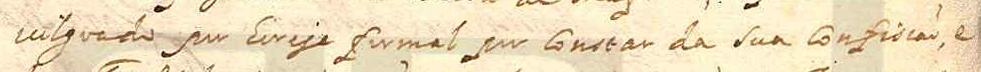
iulguado por hereje formal por Constar da sua confisçaõ, e
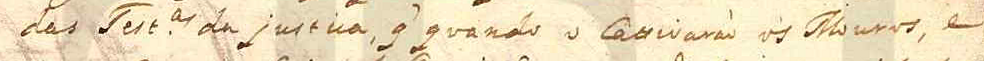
das Test.as da justiça, q̄ quando o Cattivaraõ os Mouros, e
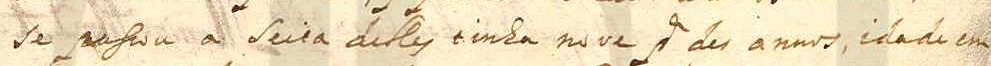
se passou a seita delles tinha nove pa des annos, idade em
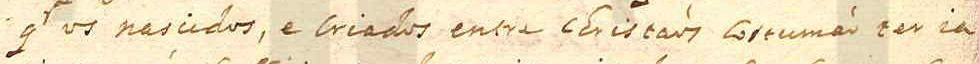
q̄ os nascidos, e criados entre christaõs costumaõ ter ia
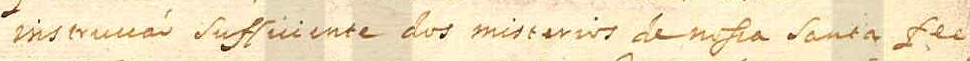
instrucçaõ sufficiente dos misterios de nossa santa fee
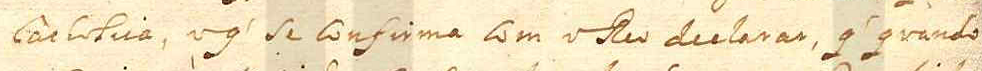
Catholica, o q̄ se Confirma Com o Reo declarar, q̄ quando
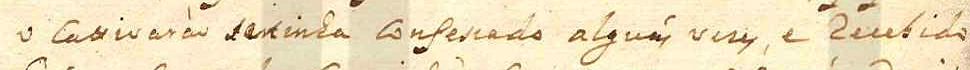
o cattivaraõ se tinha confessado alguās vezes, e Recebido
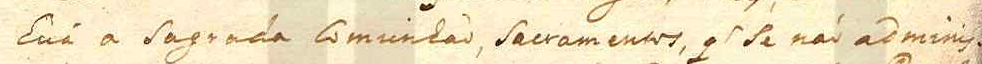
huā a sagrada Comunhaõ, sacramentos, q̄ se naõ adminis
